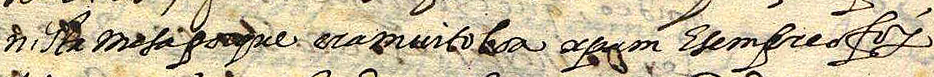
nesta mesa porque era muito boa xpam E sempre o foy
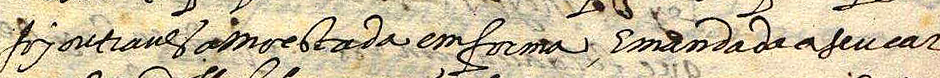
foy outra ues amoestada em forma, E mandada a seu car
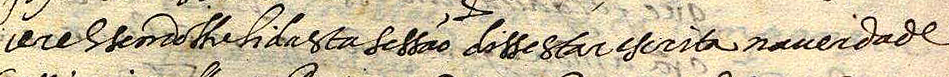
cere E sendolhe lida esta sessão disse estar escrita na uerdade
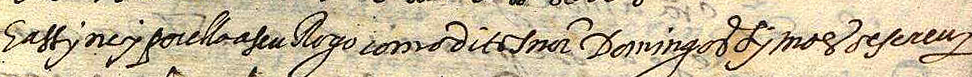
E assyney por ella a seu Rogo com o dito snor̄ Domingos Symoes o escreuj
